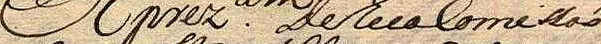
Aprez.am de hua Comissaõ
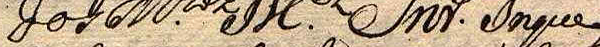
dos M.toz Ill.ez Snr.es Inque
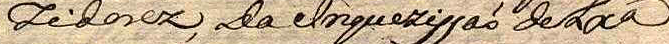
zidorez, Da Inquezissaõ de Lxa
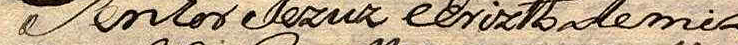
Senhor Iezuz chriztto de miL
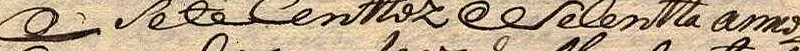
e SeteCenttoz E Secentta annoz
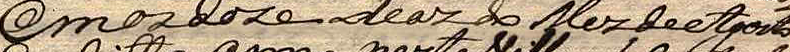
em os doze deaz do Mez de Agosto
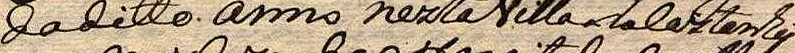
do ditto anno nezta Villa da Castanhej
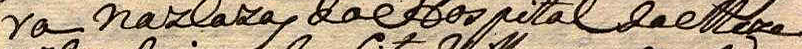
ra naz cazas do Hospital da Meze
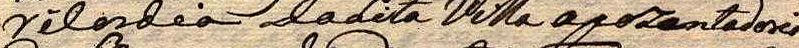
ricordia da dita Villa apozentadoria
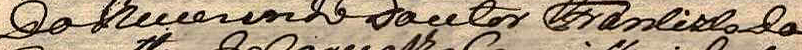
Do Reuerendo Doutor Francizco da
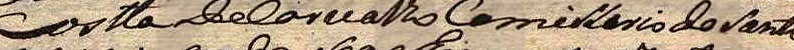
Costta de Carvalho Comissario do santo
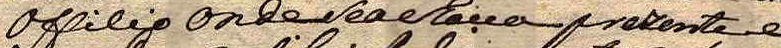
officio onde se achaua prezente, e
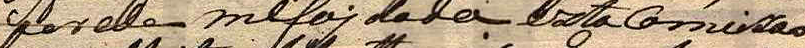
por elle me foj dada ezta Comissaõ
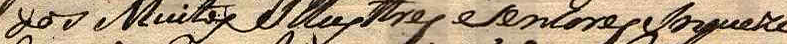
dos Muitos Illusttres Senhores Inquezi
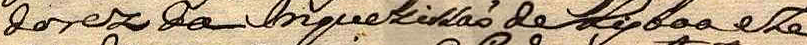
dorez da Inquezissaõ de Lisboa ele
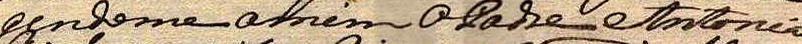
gendome a mim o Padre Antonio
